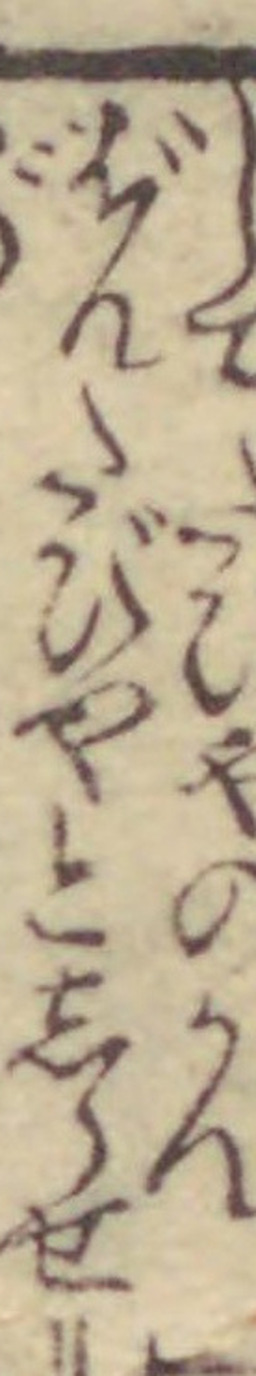ばんたびやとしらせ
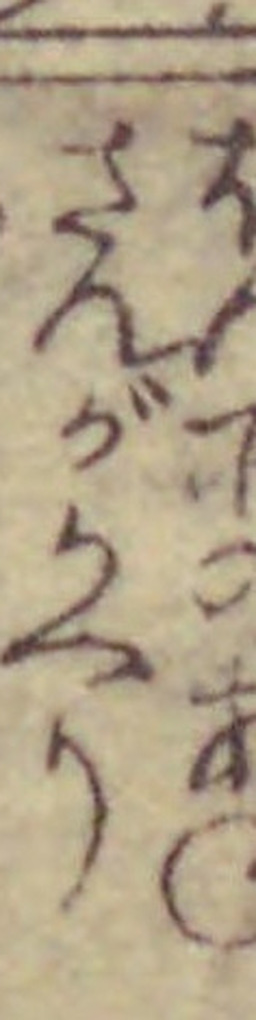さんがかへり
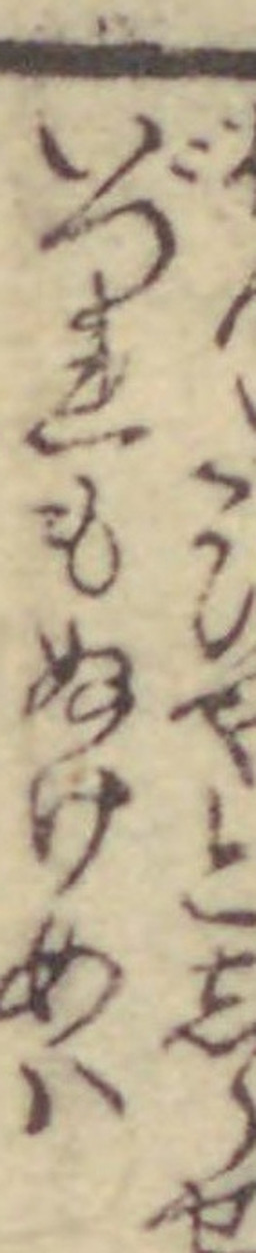いづれもぬけめは
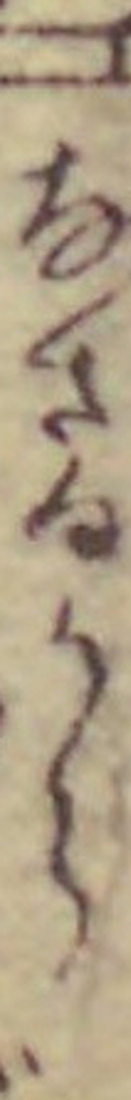なさるから
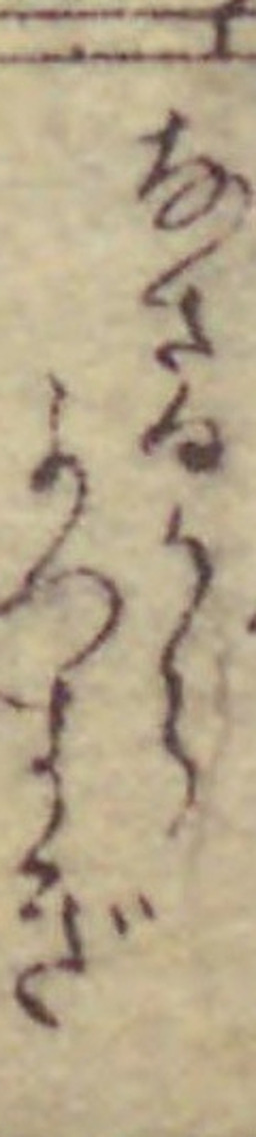よつすぎ
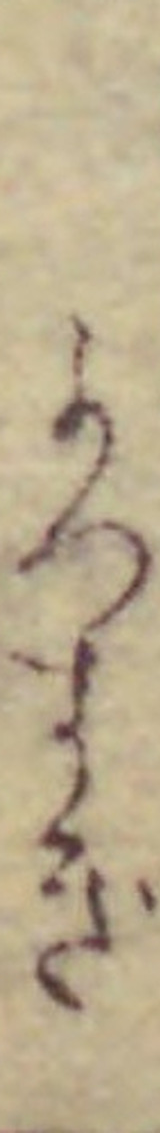よつすぎ
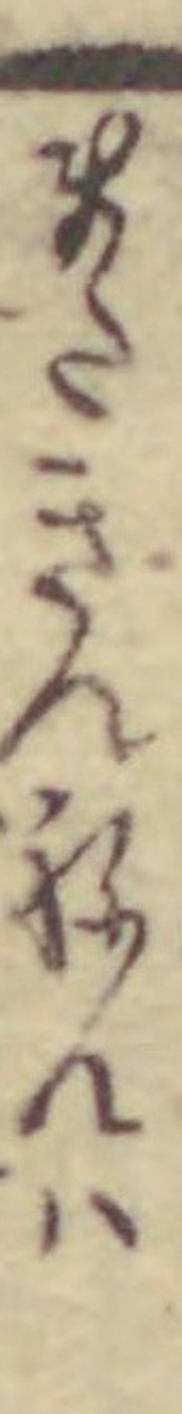またきんねんは
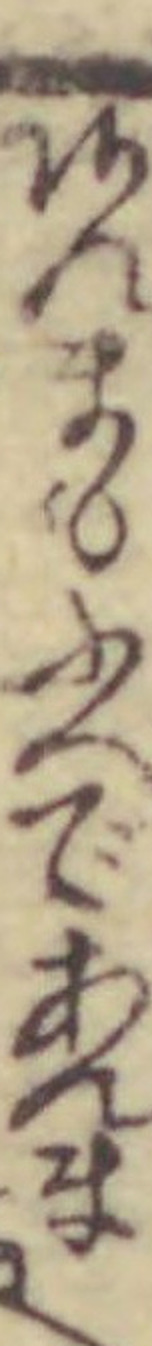あんまもふへであんま
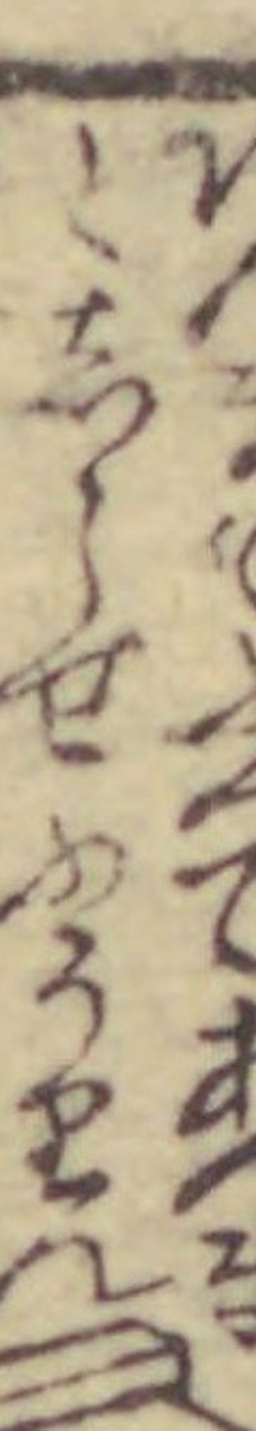としらせふうりん
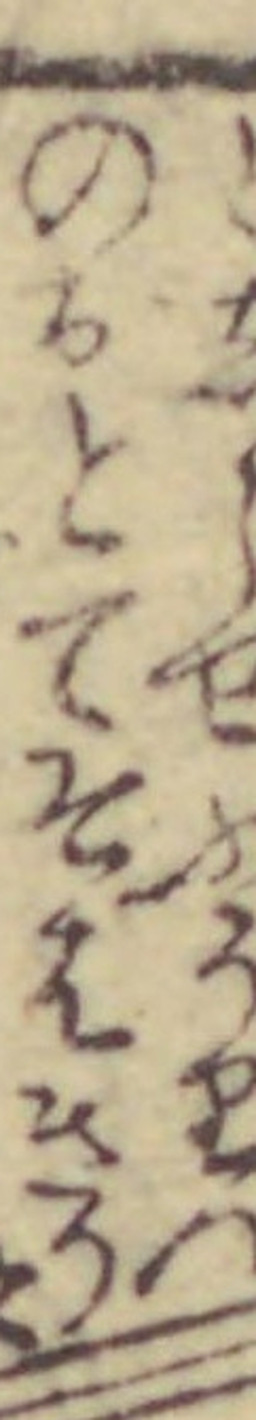のおとてそはきりと
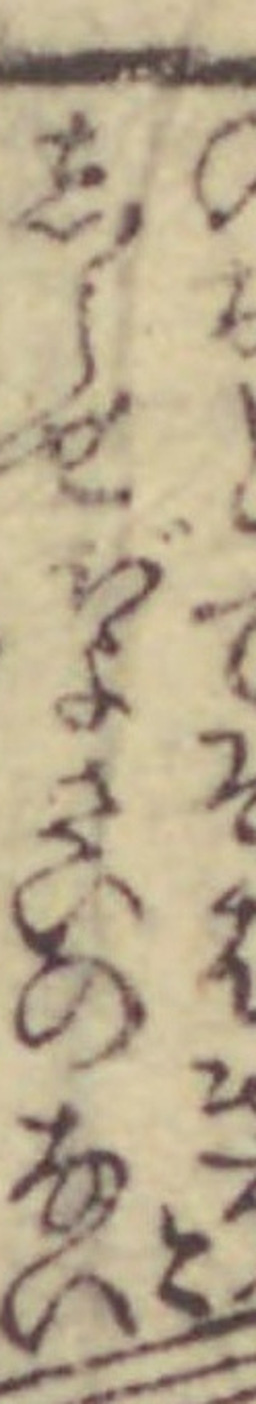しらせぢよさいのない
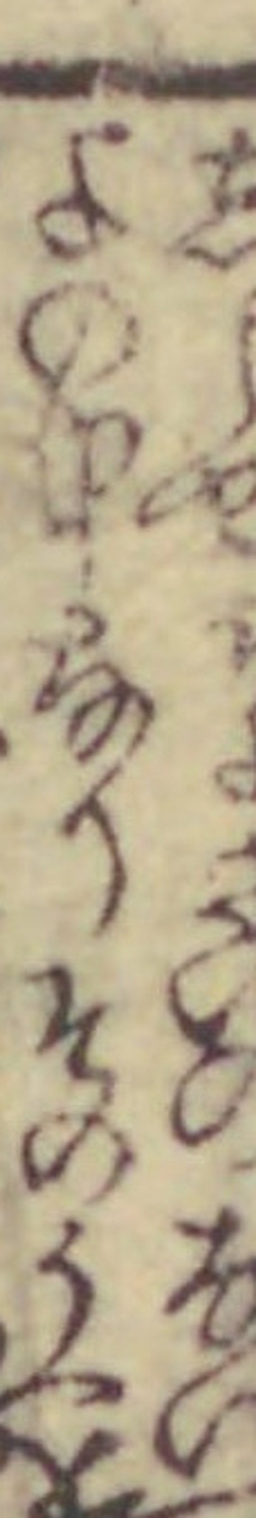よの中なりそのうへを
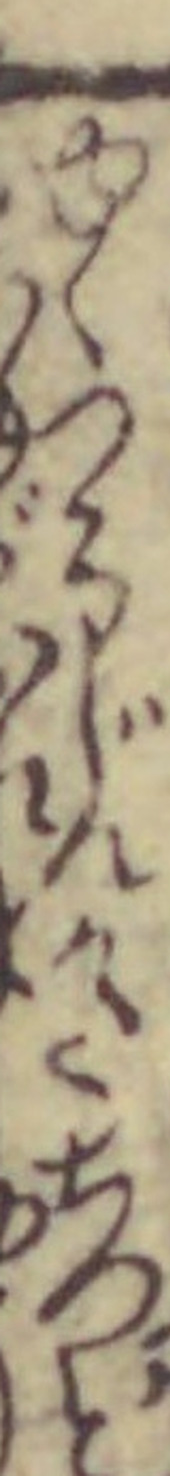ゆくつうじんかたちつと
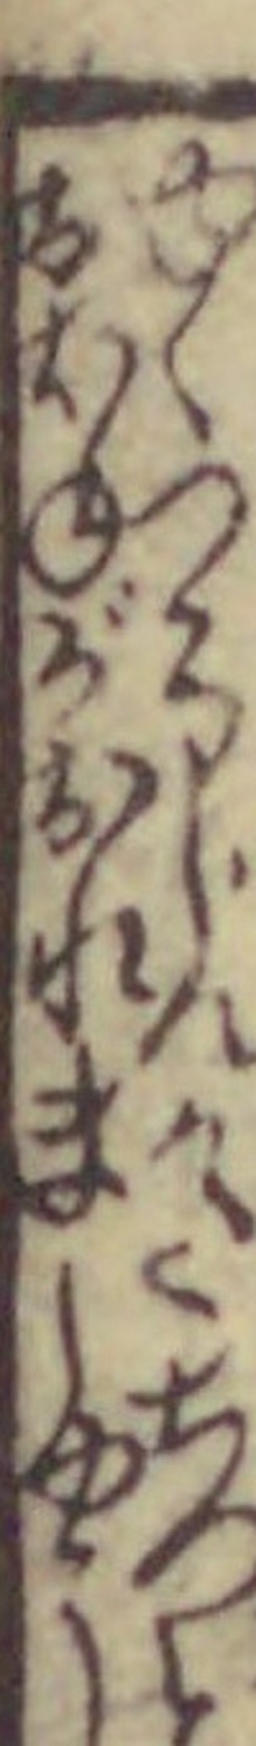おほねがおれましやう
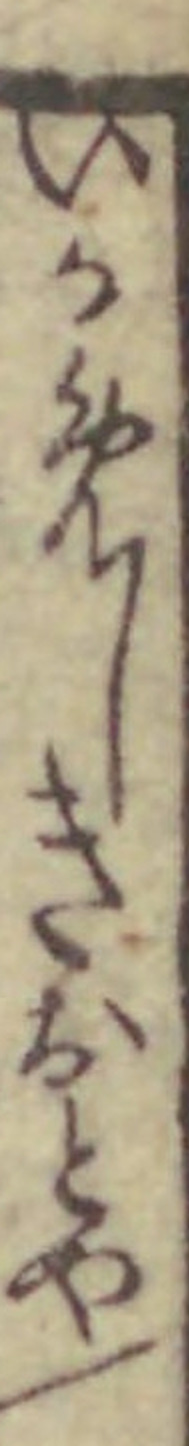いかめしきおとや
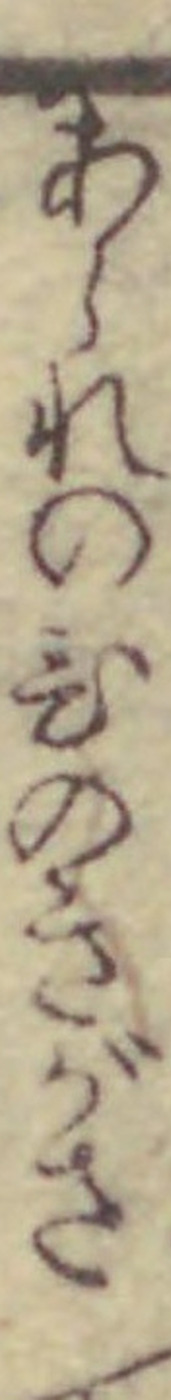あられのひのきがさ
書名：大通人穴[サガシ] 3巻
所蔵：国立国会図書館 National Diet Library, JAPAN
